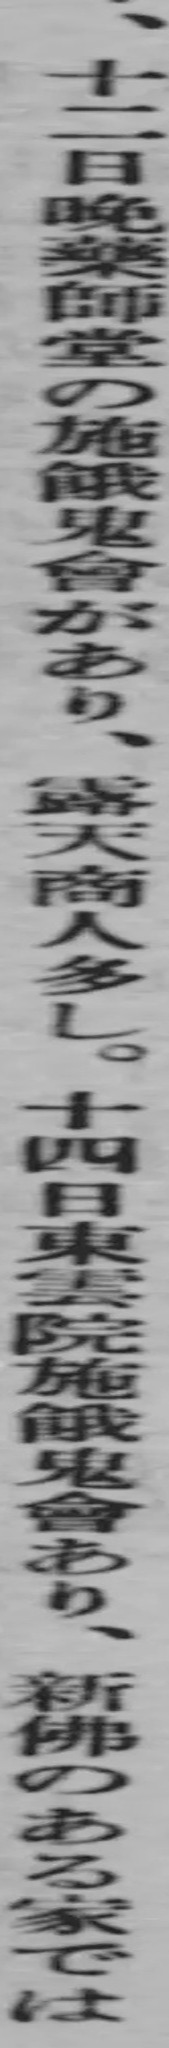イ、十二日晩藥師堂の施餓鬼會があり、露店商人多し。十四日東雲院施餓鬼會あり、新佛のある家では
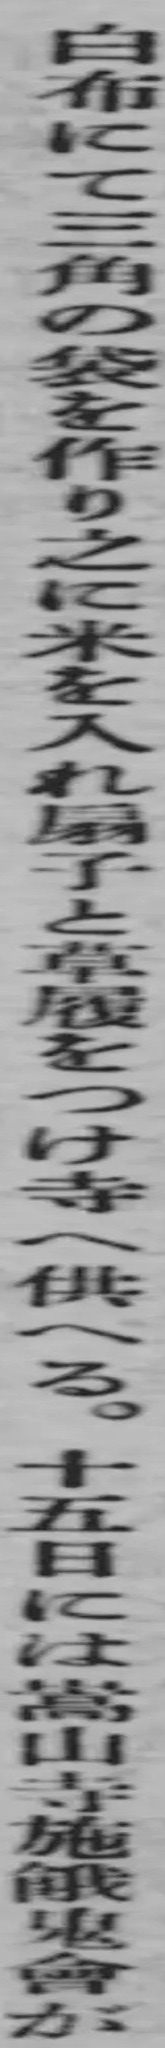白布にて三角の袋を作り之に米を入れ扇子と草履をつけ寺へ供へる。十五日には嵩山寺施餓鬼會が
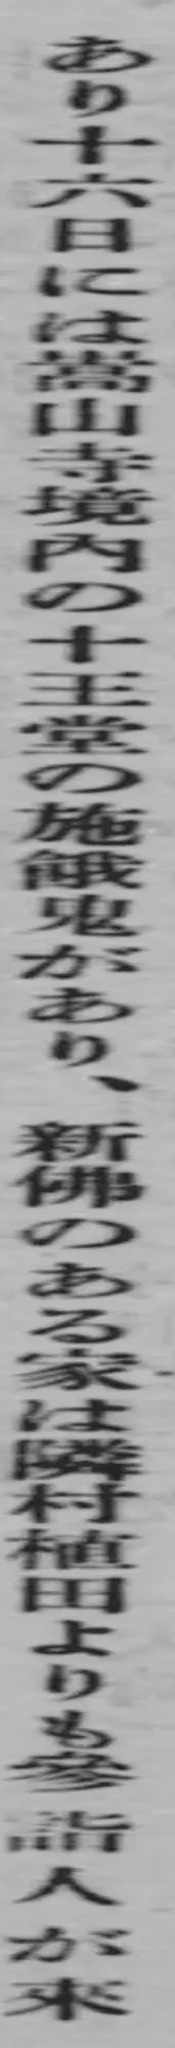あり十六日には嵩山寺境内の十王堂の施餓鬼があり、新佛のある家では隣村植田よりも參詣人が來
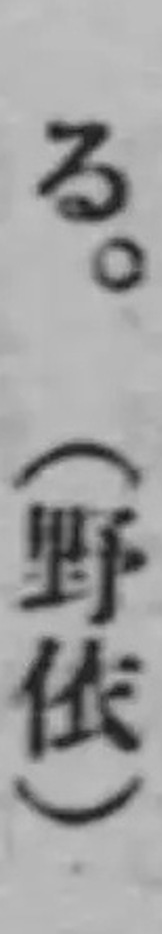る。(野依)
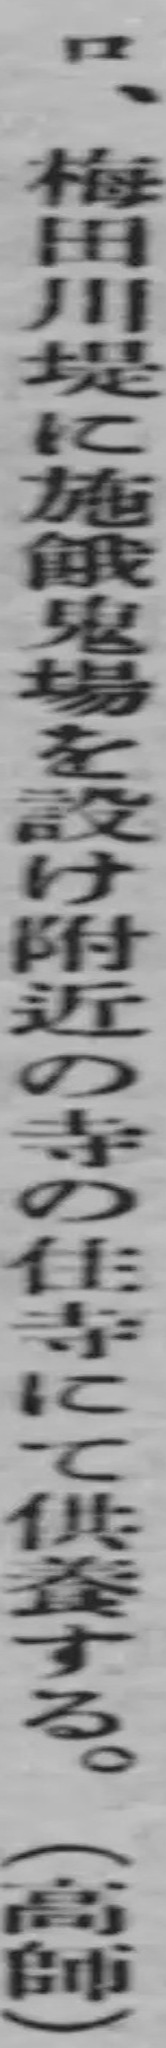ロ、梅田川堤に施餓鬼場を設け附近の寺の住寺にて供養する。(高師)
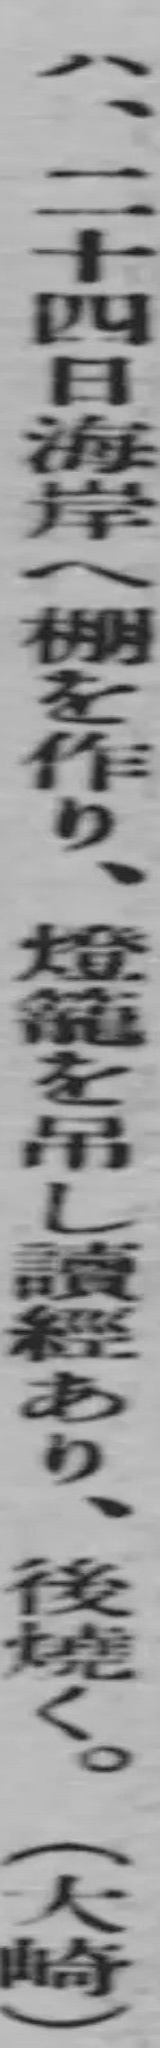ハ、二十四日海岸へ棚を作り、燈籠を吊し讀經あり、後燒く。(大崎)
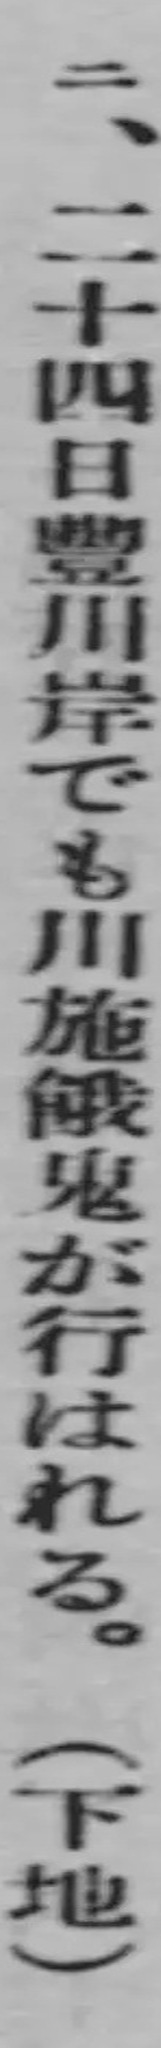ニ、二十四日豐川岸でも川施餓鬼が行はれる。(下地)

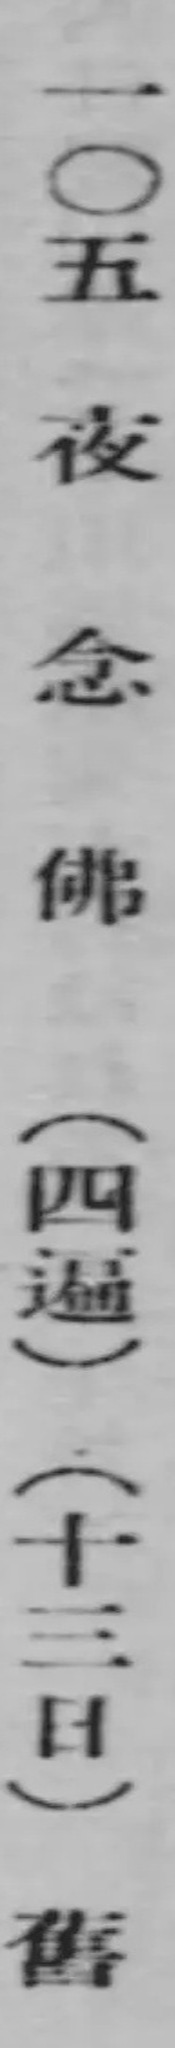一〇五夜念佛(四遍)(十三日)舊
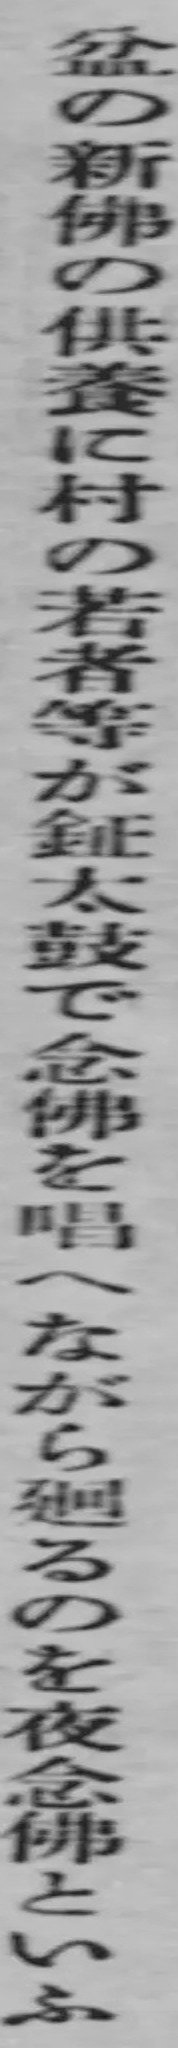盆の新佛の供養に村の若者等が鉦太鼓で念佛を唱へながら廻るのを夜念佛といふ
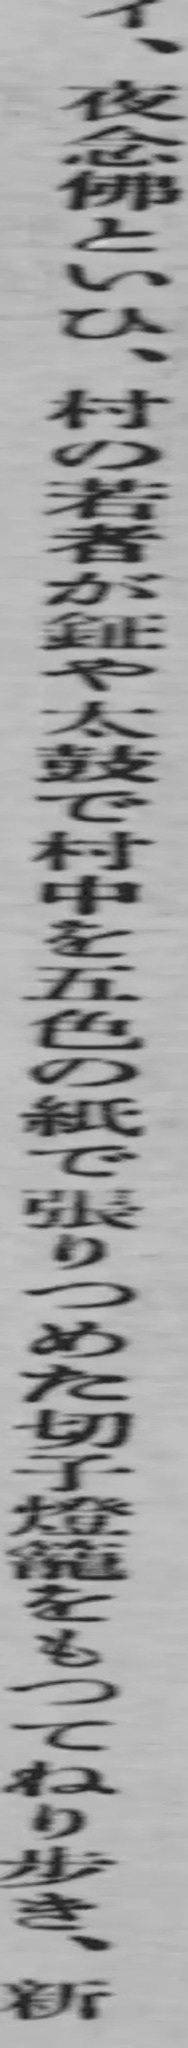イ、夜念佛といひ、村の若者が鉦や太鼓で村中を五色の紙で張りつめた切子燈籠をもつてねり歩き、新
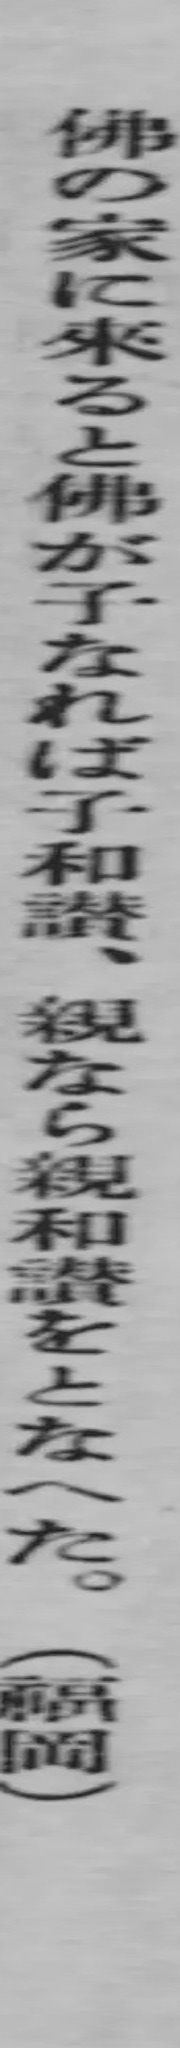佛の家に來ると佛が子なれば子和讃、親なら親和讃をとなへた。(福岡)
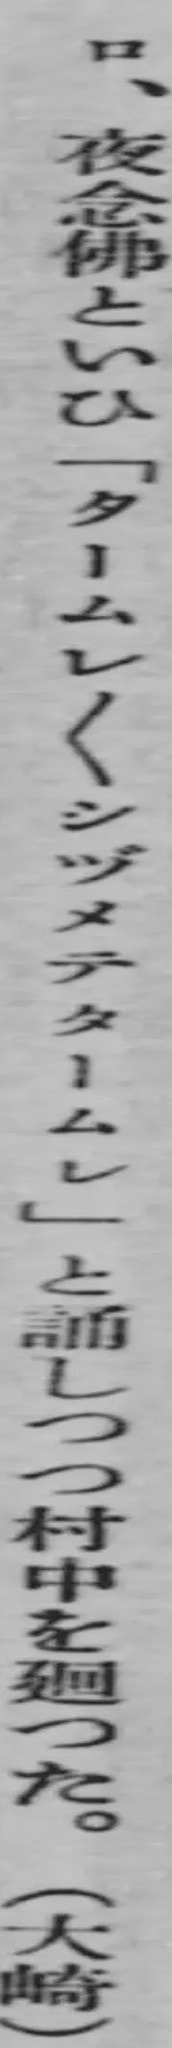ロ、夜念佛といひ「タームレ〳〵シヅメテタームレ」と誦しつつ村中を廻つた。(大崎)
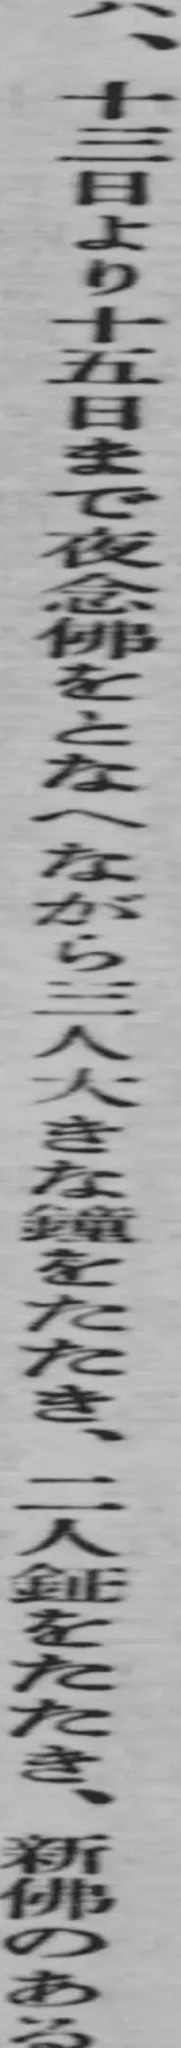ハ、十三日より十五日まで夜念佛をとなへながら三人大きな鐘をたたき、二人鉦をたたき、新佛のある
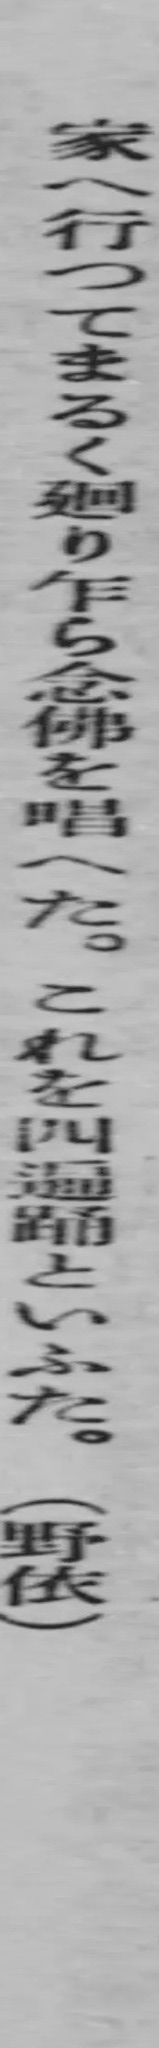家へ行つてまるく廻り乍ら念佛を唱へた。これを四遍踊といふた。(野依)
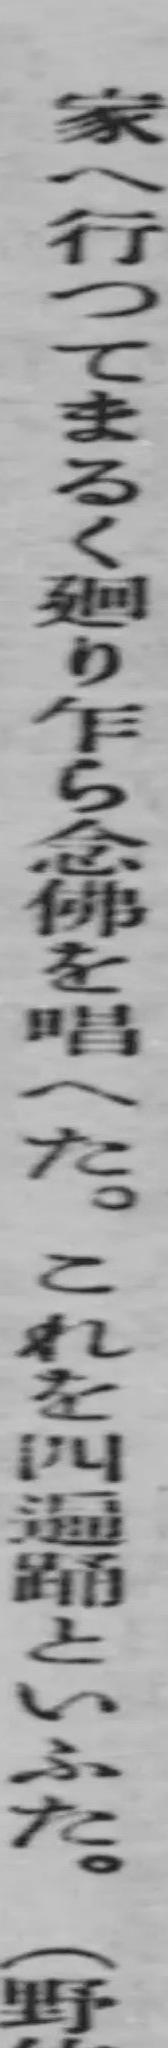家へ行つてまるく廻り乍ら念佛を唱へた。これを四遍踊といふた。(野依)
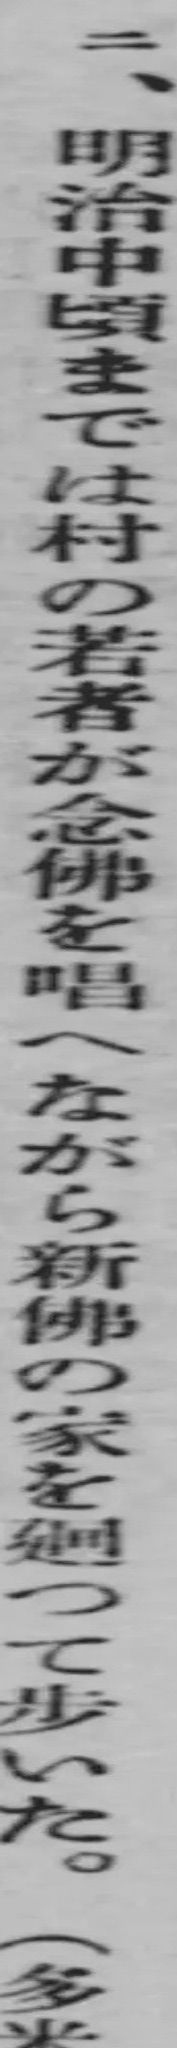ニ、明治中頃までは村の若者が念佛を唱へながら新佛の家を廻つて歩いた。(多米)
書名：豊橋の年中行事
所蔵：国立国会図書館 National Diet Library, JAPAN
